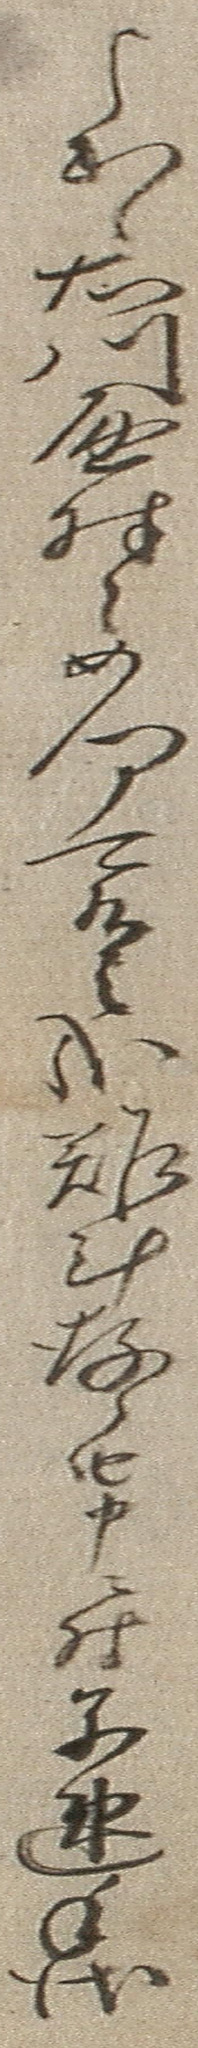申出候右川通村々如何可有候哉難計存候由申に付早速手代
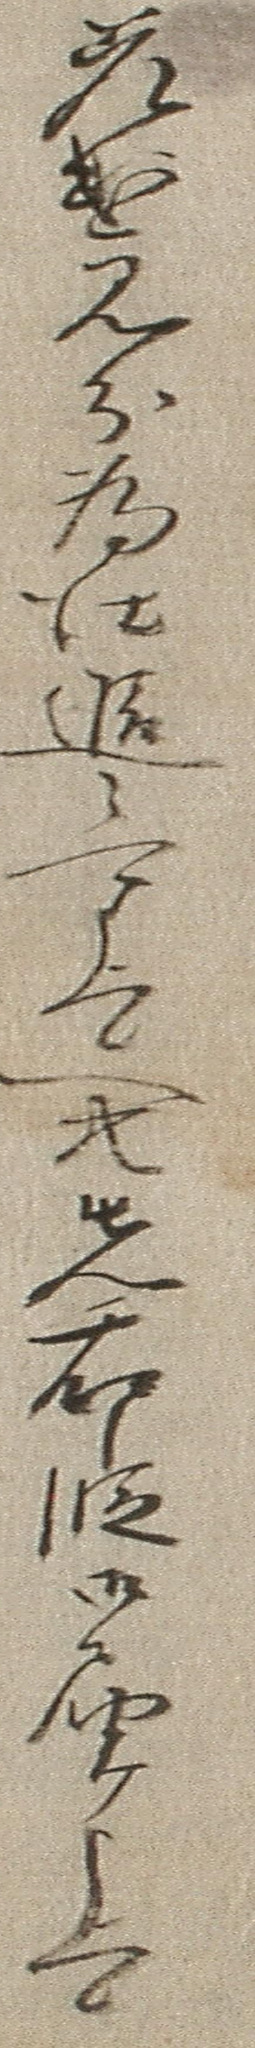差遣見分為仕追々可申上候へ共先右之段御届申上候
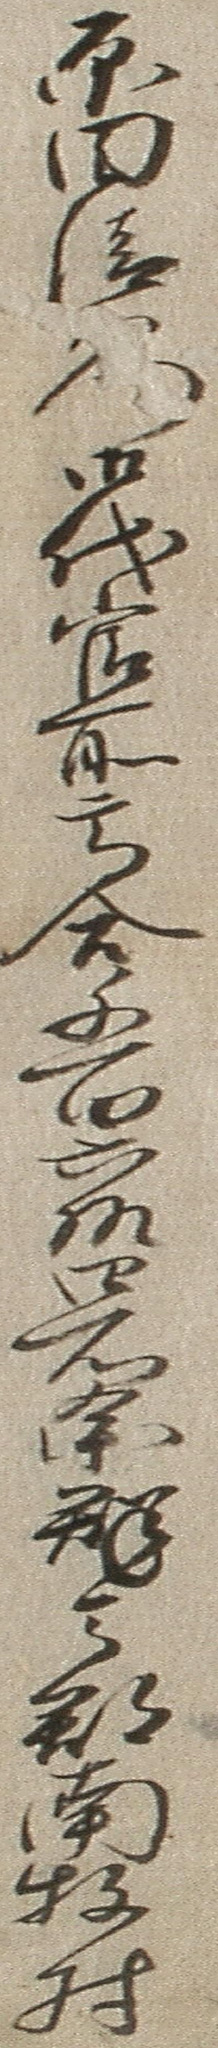原田清右衛門御代官所高合千百六拾四石余群馬郡南牧村
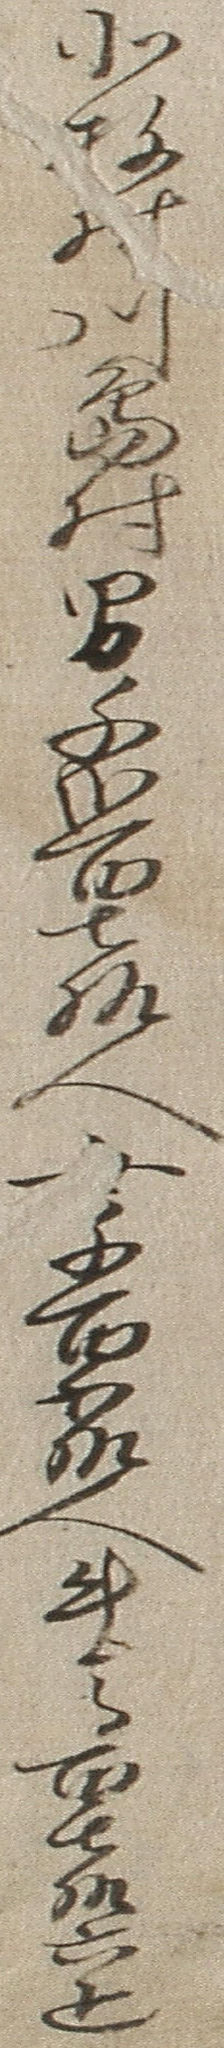北牧村川島村男千弐百七拾人女千百五拾人牛馬百七拾六疋
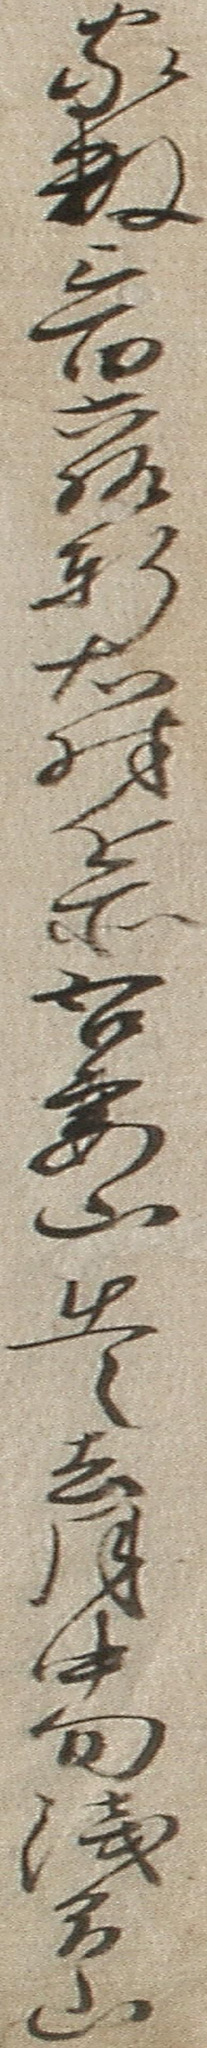家数三百六拾軒右村近所吾妻山在之去月中旬浅間山
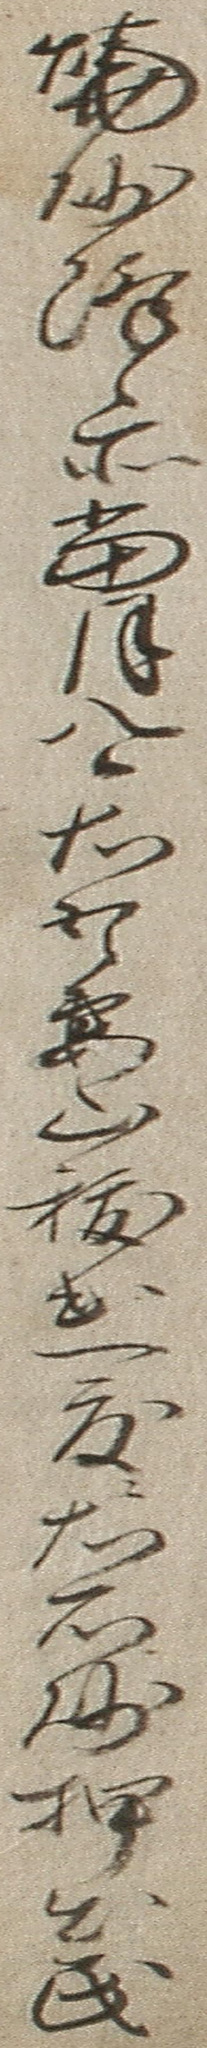焼砂降候所当月八日右吾妻山抜出一度に右石砂押出民
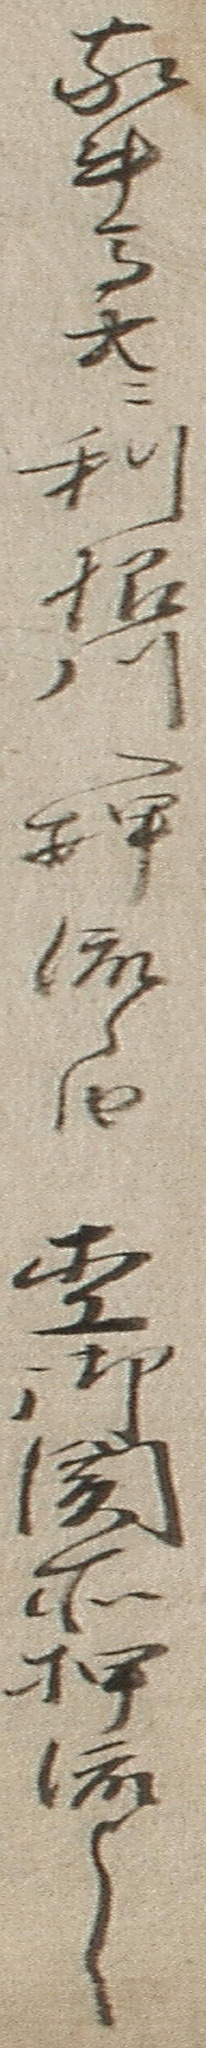家牛馬共に利根川へ押流候由杢御関所押流申候

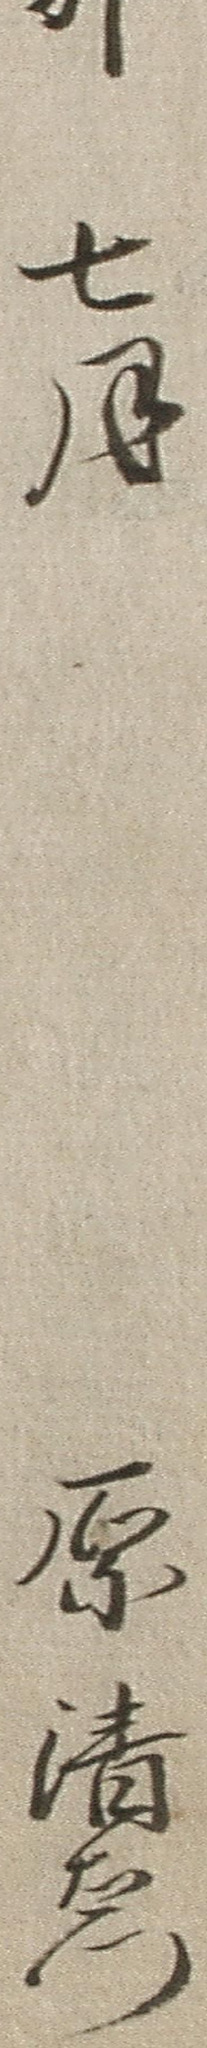卯七月原清右衛門
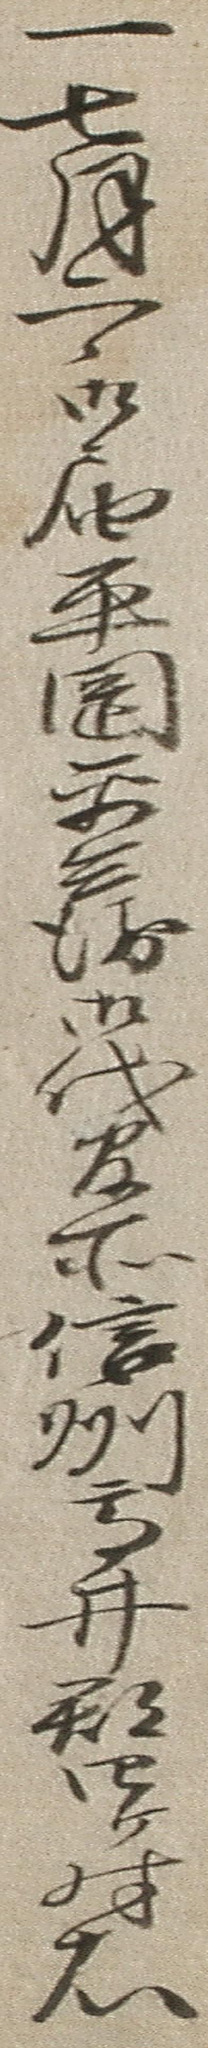一七月二日御届平岡平兵衛御代官所信州高井郡四ヶ村右
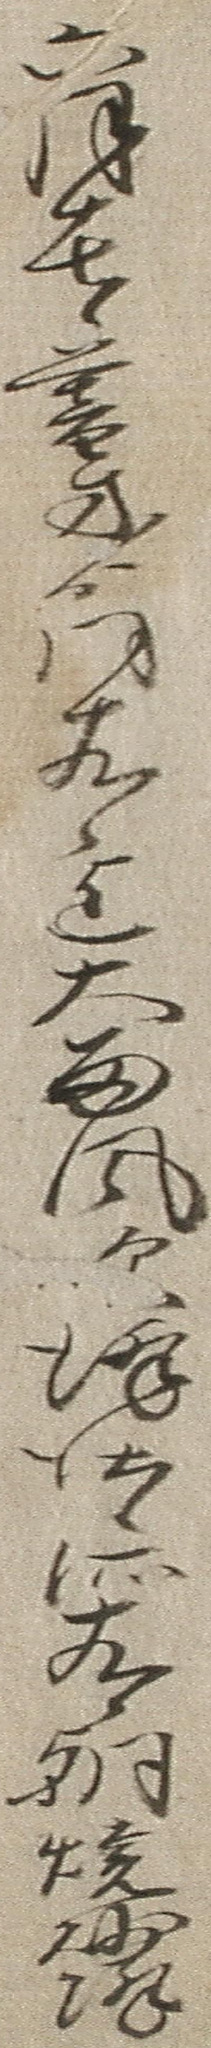六月十七日暮方ゟ同十九日迄大雨風吹降仕候所十九日朝焼砂降
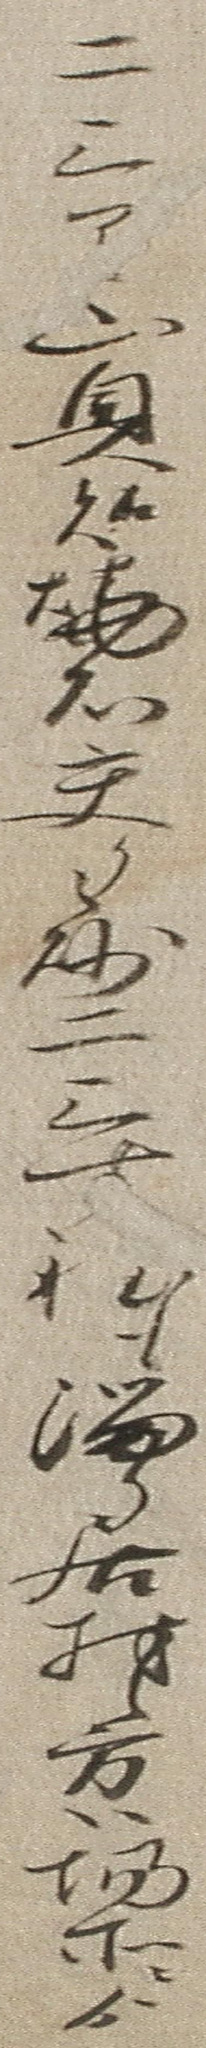二三里山奥江者焼石交り之候砂二三寸程も溜り居村方は場所にゟ
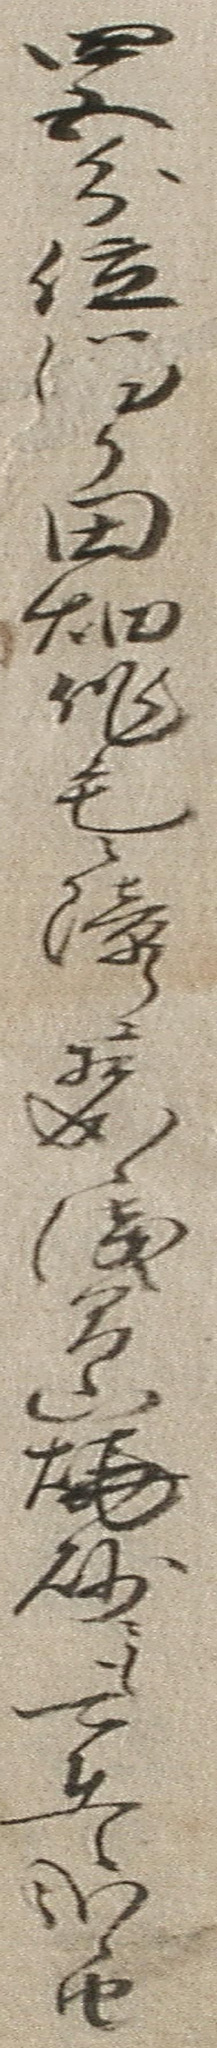四五分位溜り田畑作毛に障りに相成候浅間山焼砂にも可在之哉候由
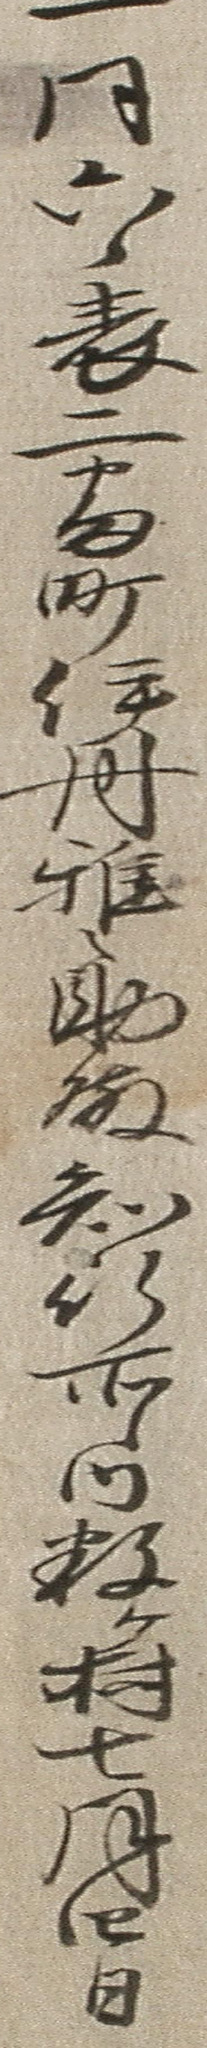一同六日表二番町伊丹雅之助殿知行所之内数ヶ村七月四日
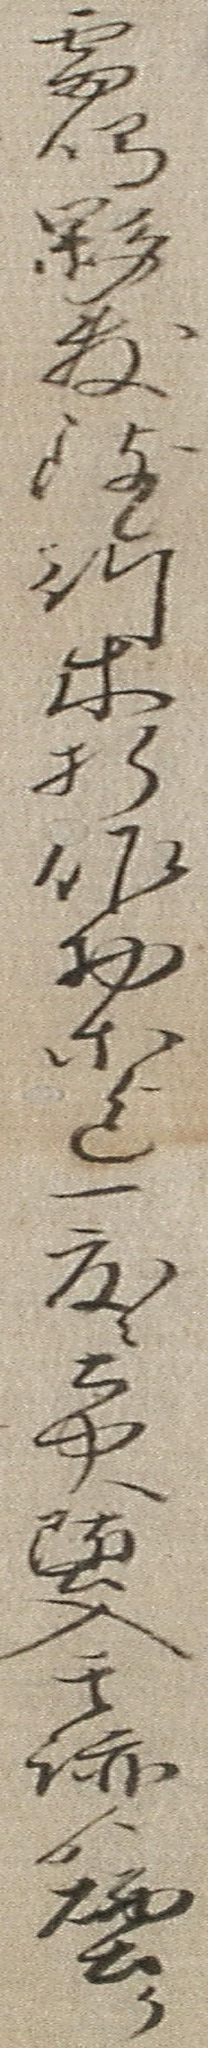雷鳴夥敷致し竹木折作物等迄一度に土中へ堕入其跡ゟ煙り
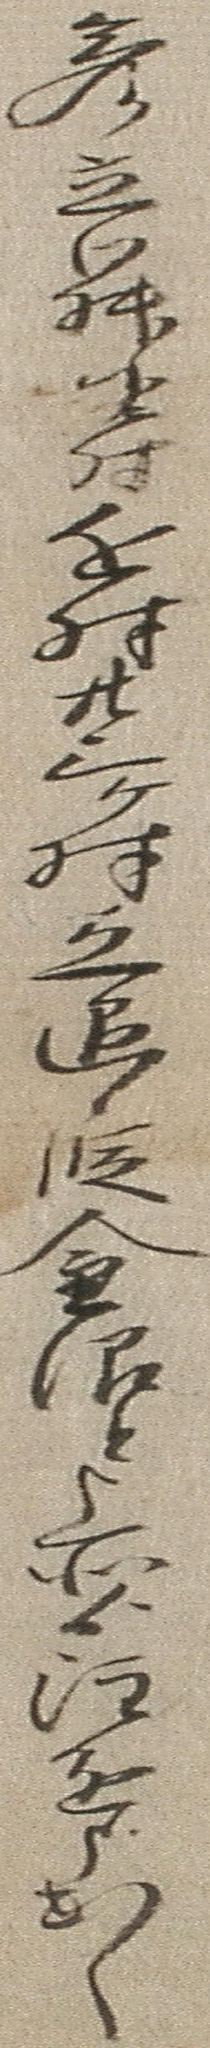多く立昇候ニ付近村廿三ヶ村立退候段金沼と申所ゟ注進申出候
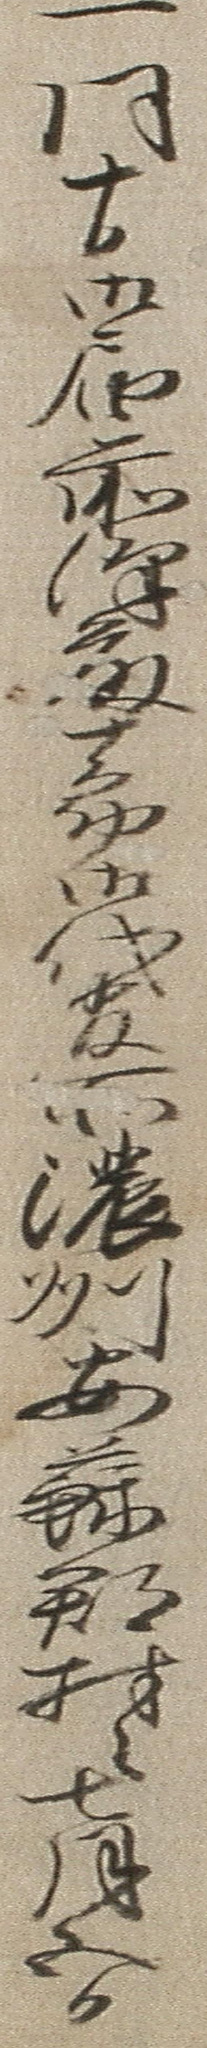一同十日御届前沢藤十郎御代官所濃州安蘇郡村々七月五日
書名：太平秘録抜書　浅間山燒及普賢山崩
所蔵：東京大学地震研究所図書室 Earthquake Research Institute Library, The University of Tokyo, JAPAN
